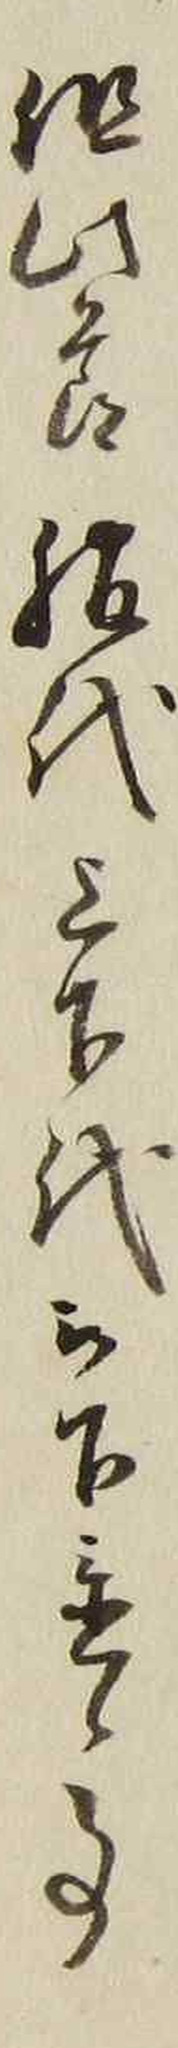但此節服代上下代被下置候事

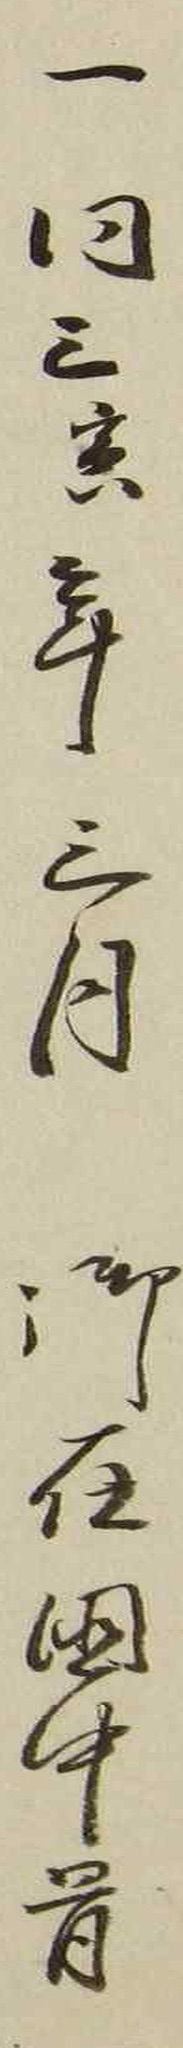一同三寅年三月御在国中骨
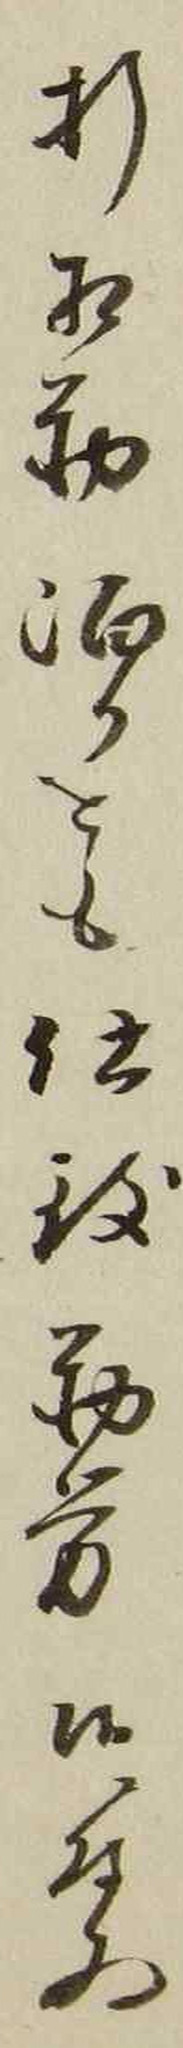折相勤泊りをも仕致勤労候ニ付為
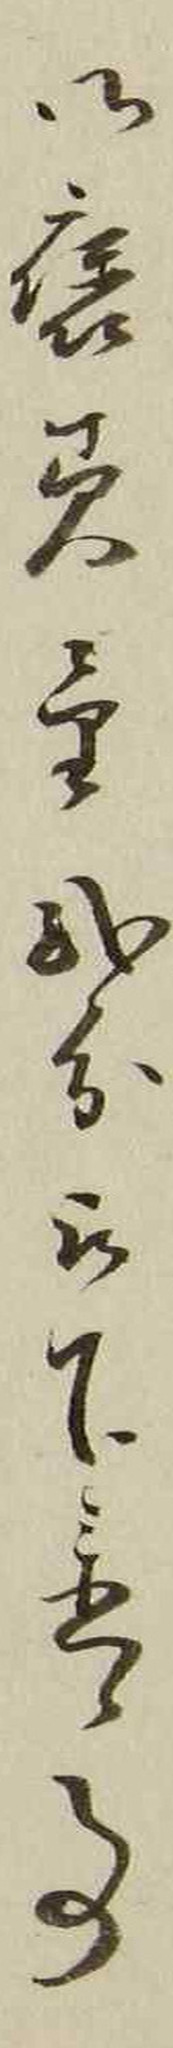御褒美金弐分被下置候事
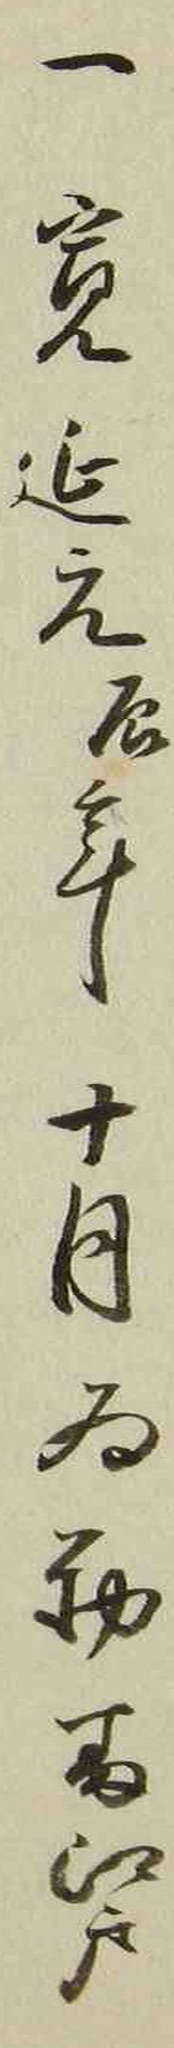一寛延元辰年十月為勤番江戸
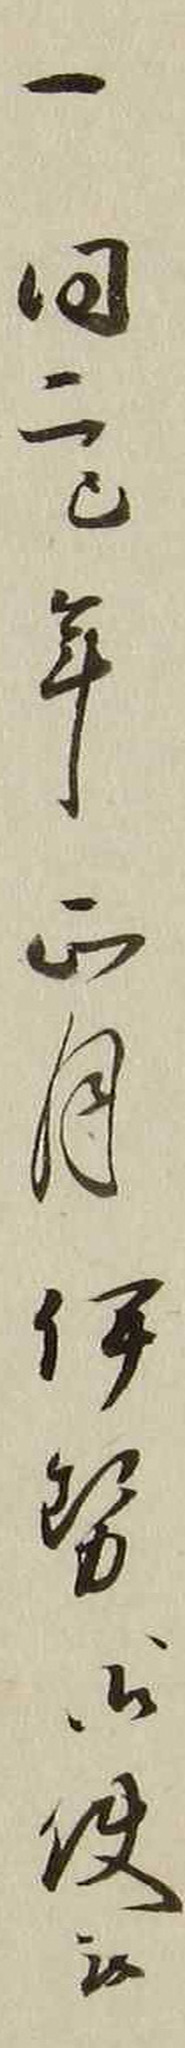一同二巳年正月伊勢御使被
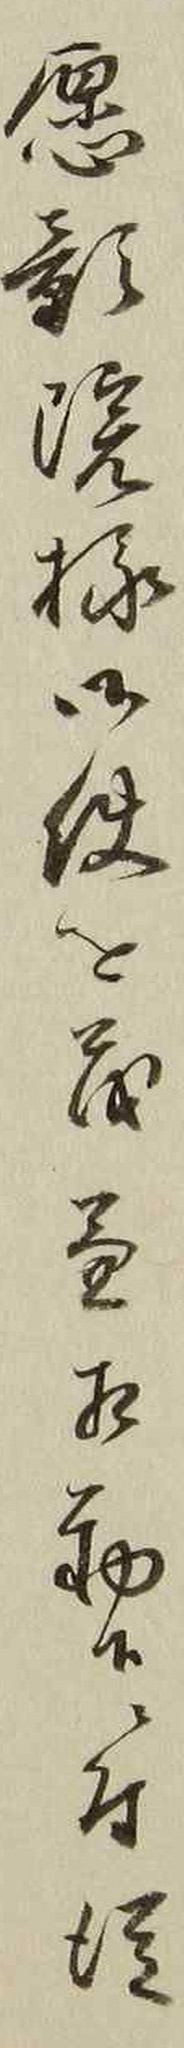愿影院様御使をも兼相勤候ニ付従
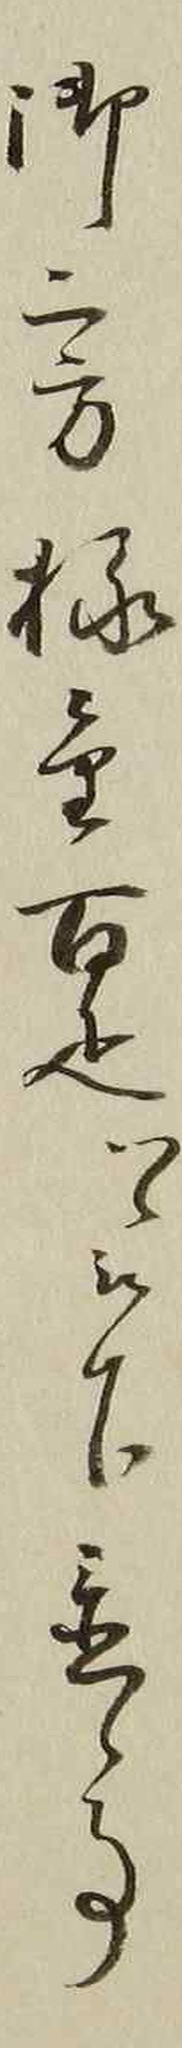御二方様金百疋ツヽ被下置候事
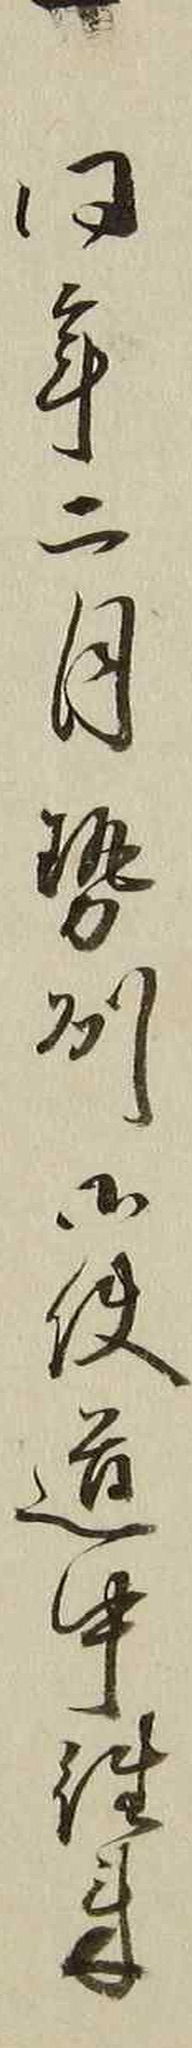一同年二月勢州御使道中往来
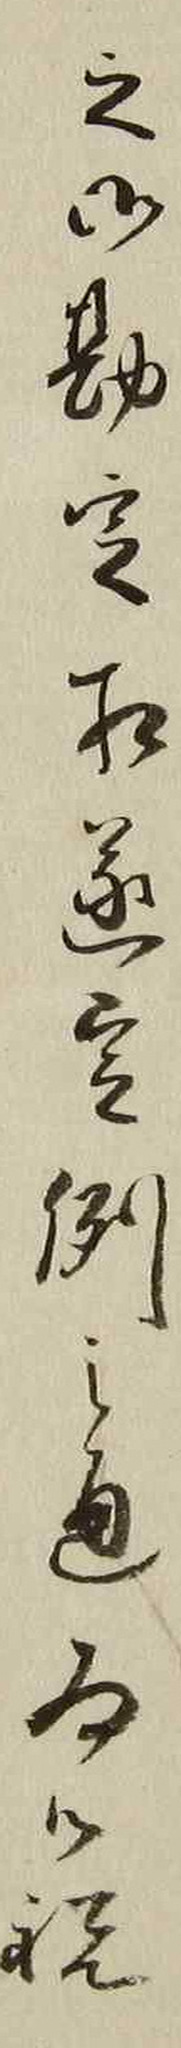之御勘定相遂定例之通為御祝
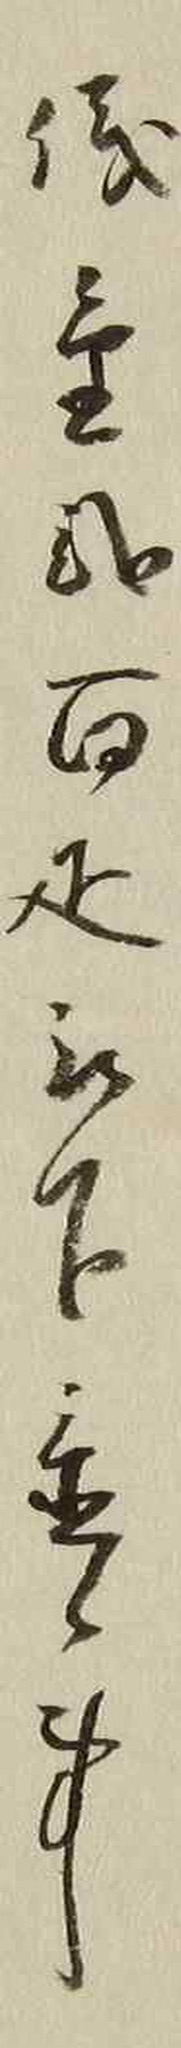儀金弐百疋被下置候事
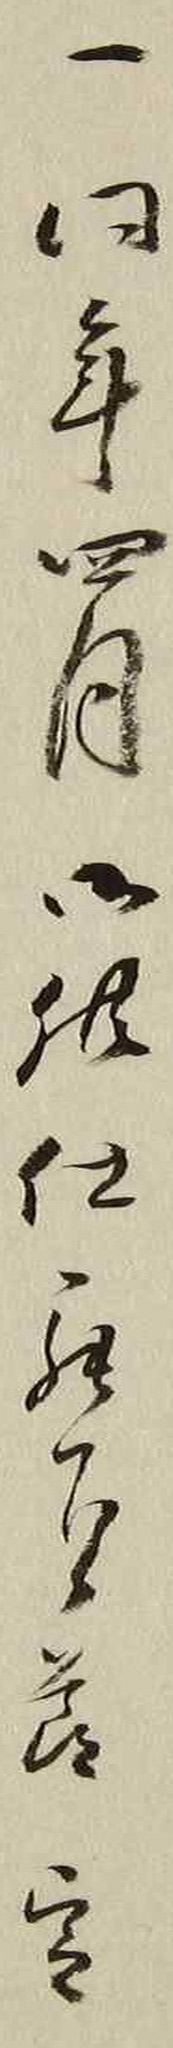一同年四月御供仕罷下候節定
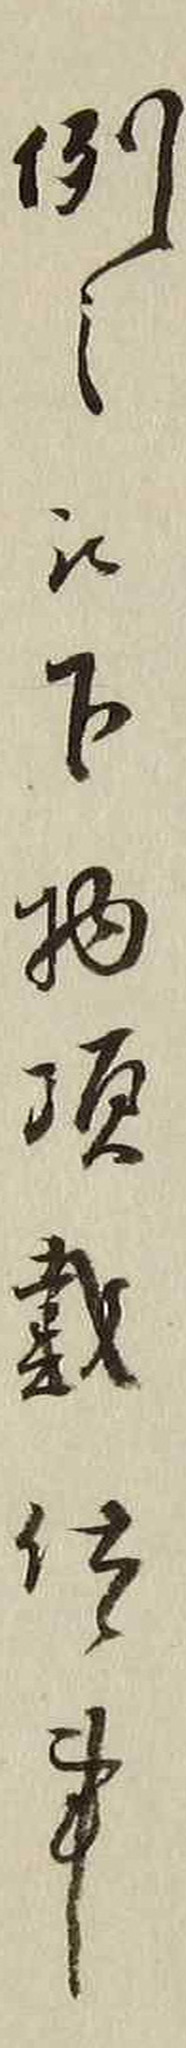例之被下物頂戴仕候事
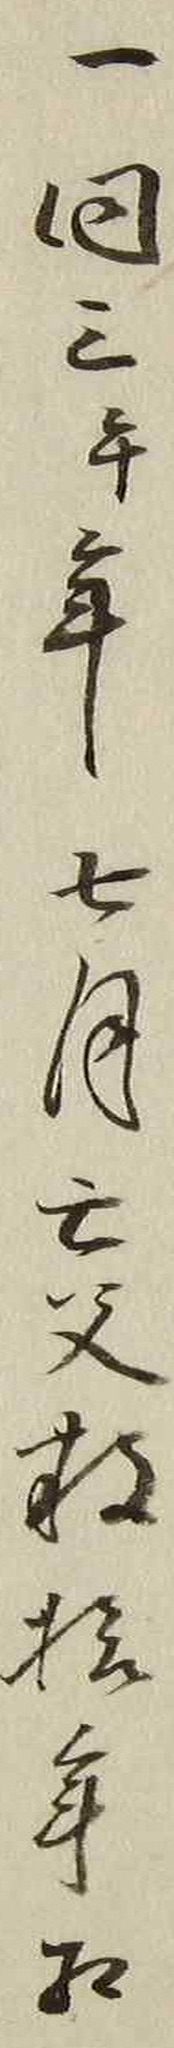一同三午年七月亡父数拾年相
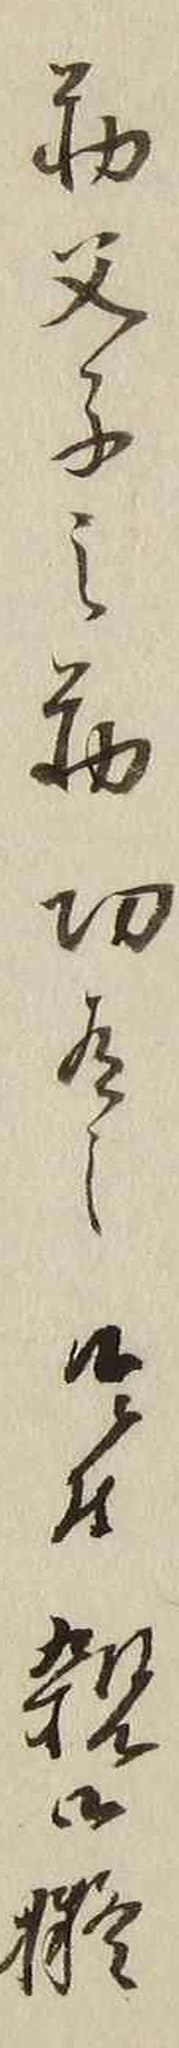勤父子之勤功有之候ニ付親御擬
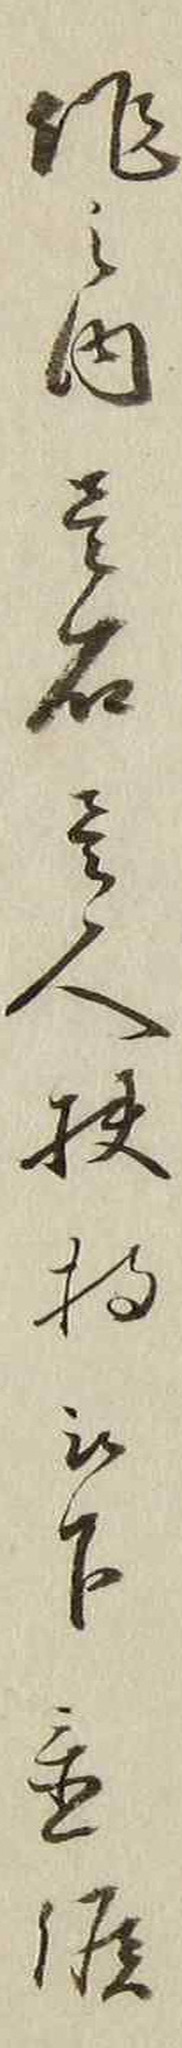作之内壱石壱人扶持被下置候
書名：諸士系譜　巻之52　に之部3
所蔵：会津若松市立会津図書館
